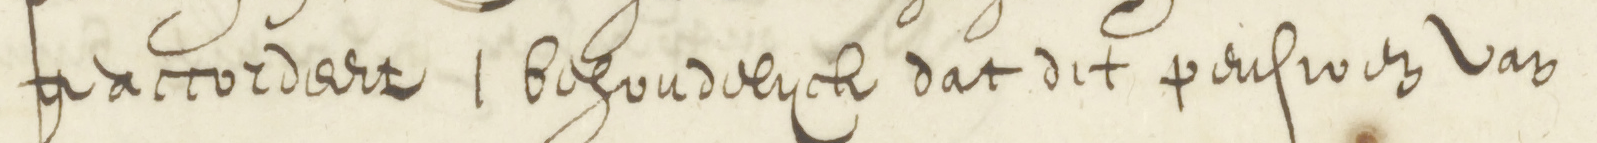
geaccordeert, behoudelyck dat dit pensioen van
